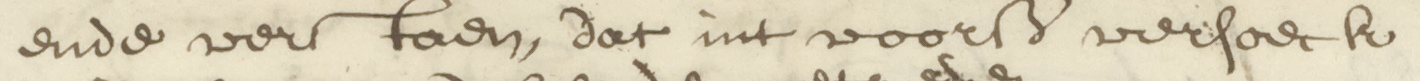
ende verstaen, dat int voorss. versoeck
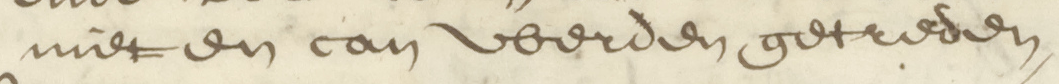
niet en can werden getreden.
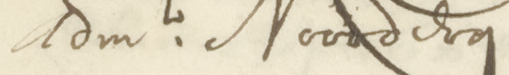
Admt. Noorderqr.
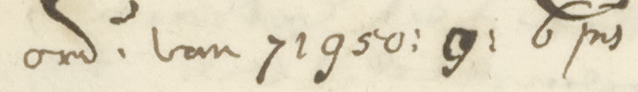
orde. van 71950: 9: 6 st.
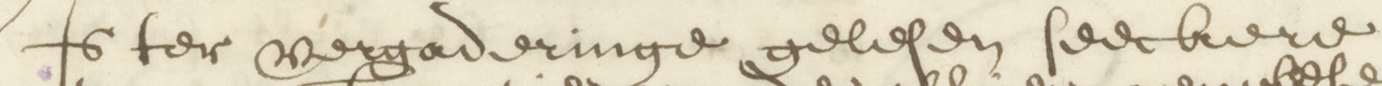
Is ter vergaderinge gelesen seeckere
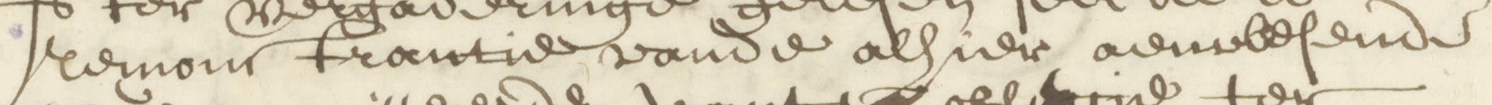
remonstrantie vande alhier aenwesende
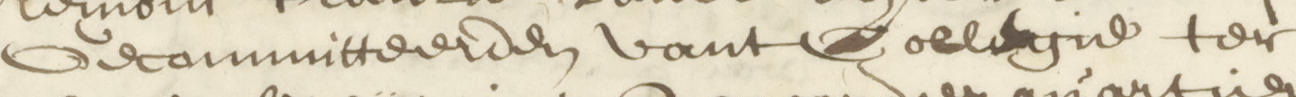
Gecommitteerden vant Collegie ter
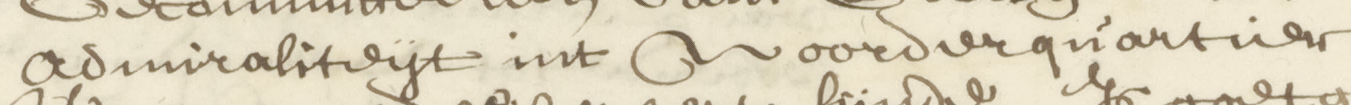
Admiraliteijt int Noorderquartier;
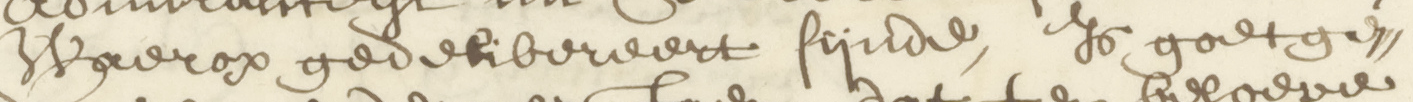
Waerop gedelibereert sijnde, Is goetge„
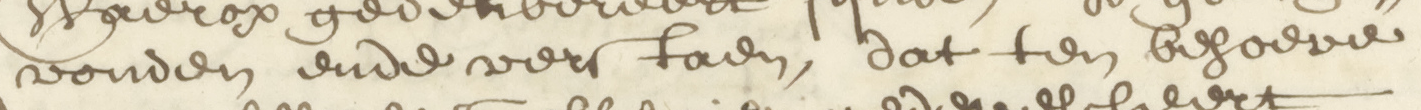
vonden ende verstaen, dat ten behoeve
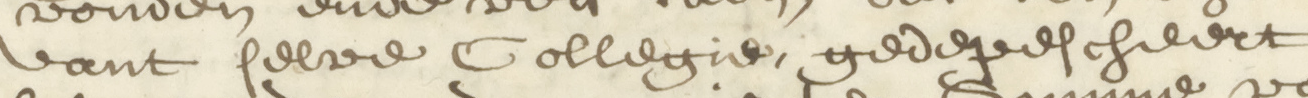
vant selve Collegie, gedepescheert
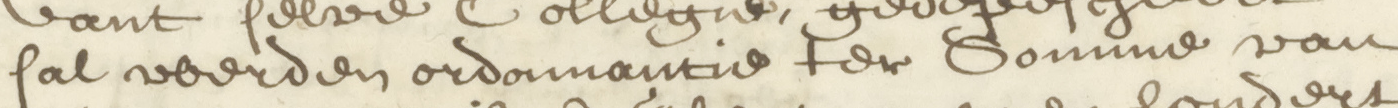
sal werden ordonnantie ter Somme van
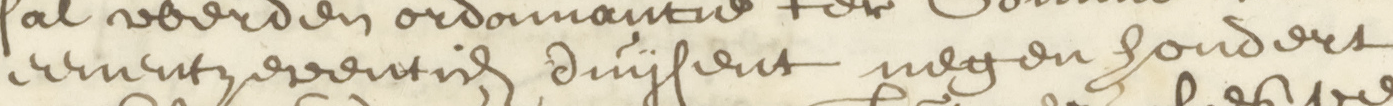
eenentzeventich duijsent negen hondert
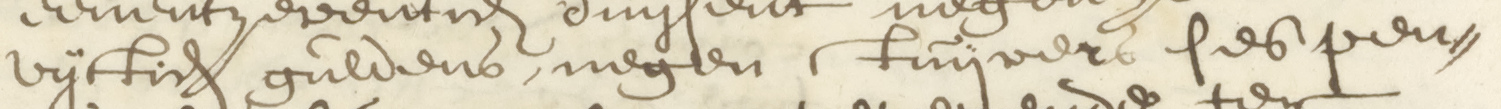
vijftich guldens, negen stuijvers ses pen„
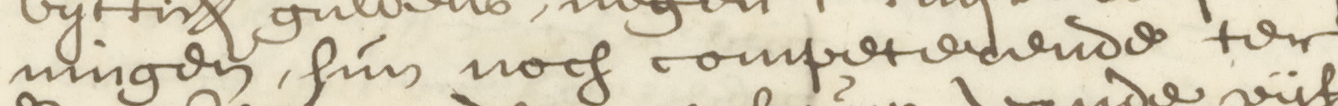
ningen, hun noch competerende ter
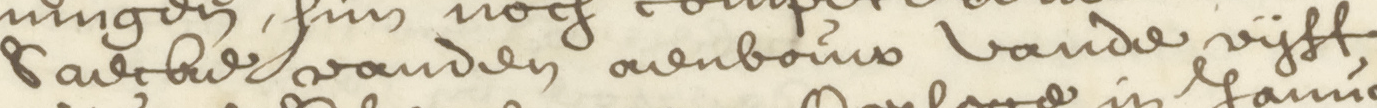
Saecke vanden aenbouw vande vijff
